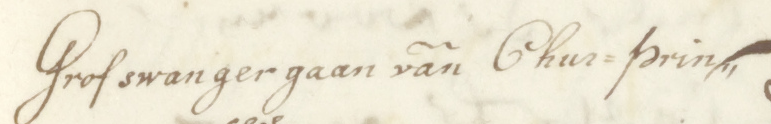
Grof swanger gaan van Chur-Prin,,
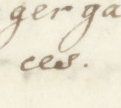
ces.
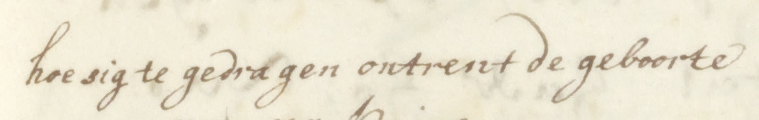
hoe sig te gedragen ontrent de geboorte
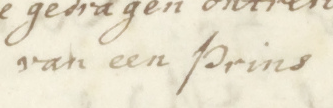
van een prins
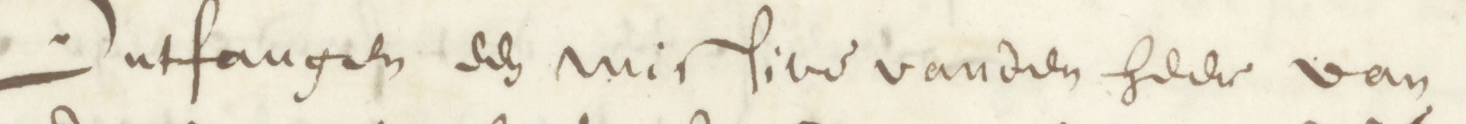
Ontfangen een missive vanden heer van
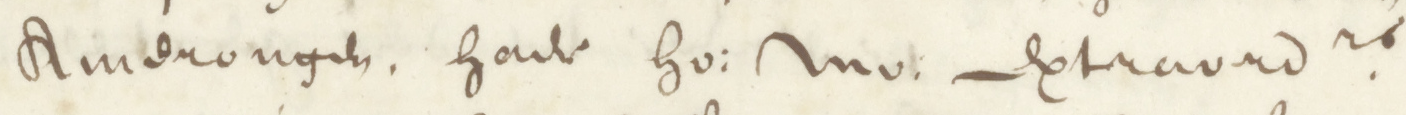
Amerongen, haer ho:mo: extraordrs.
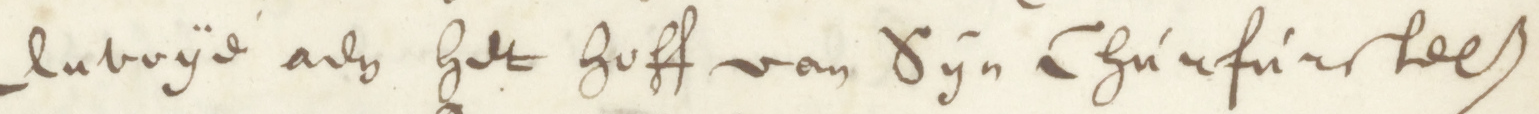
Envoijé aen het hoff van sijn Churfurstel
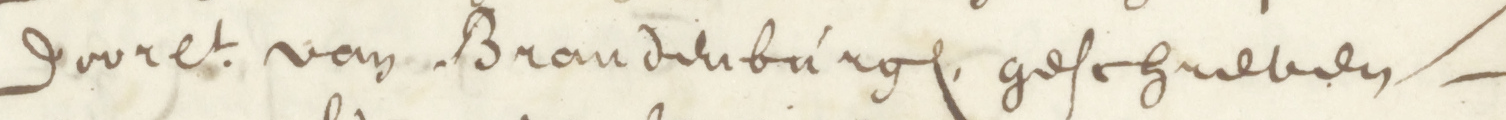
Doorlt. van Brandenburgh, geschreven
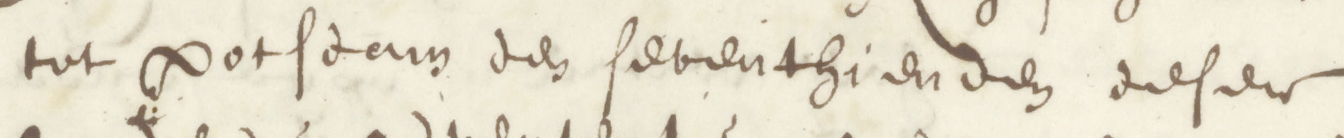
tot Potsdam den seventhien den deser
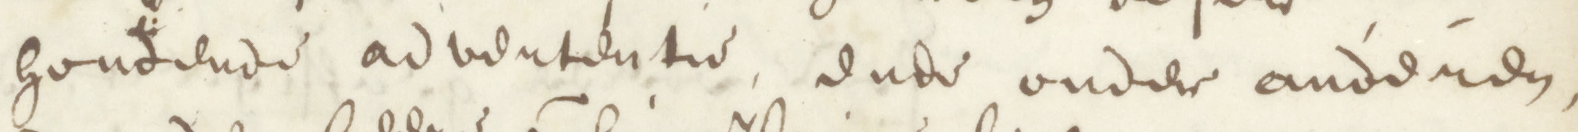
houdende advertentie, ende onder anderen
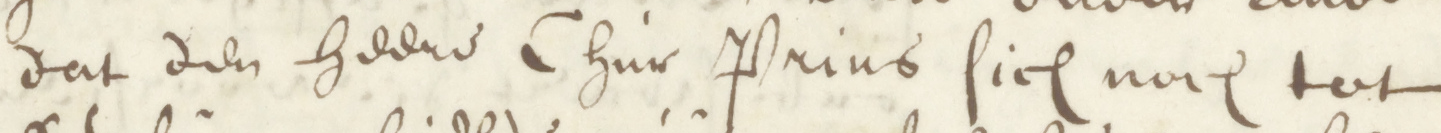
dat den heere Chur Prins sich noch tot
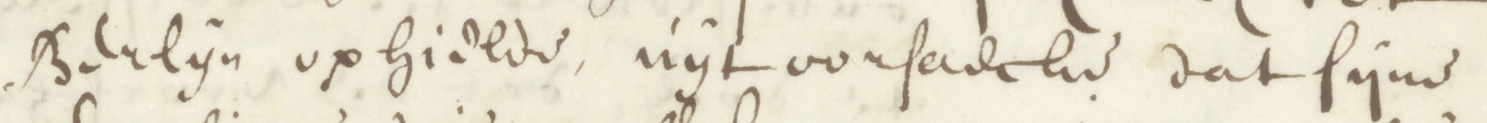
Berlijn ophielde, uijt oorsaecke dat sijne
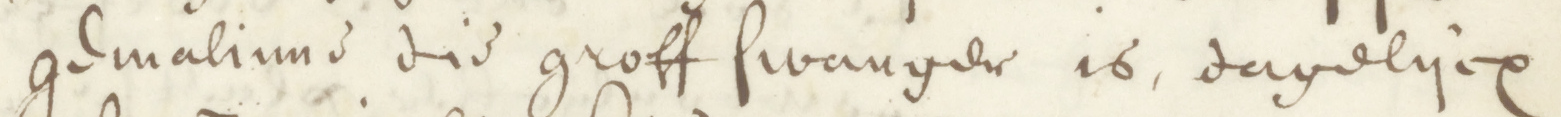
gemalinne die groff swanger is, dagelijcx
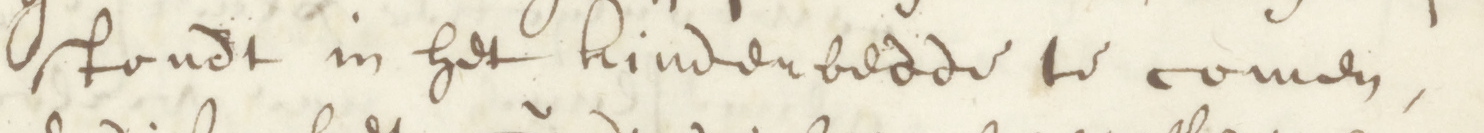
stondt in het kinderbedde te comen,
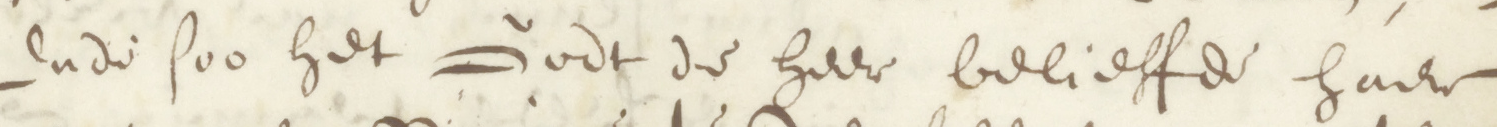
ende soo het Godt de heer belieffde haer
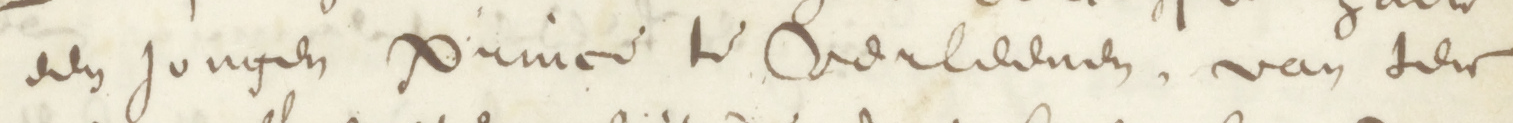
een jongen Prince te verleenen, van ter
